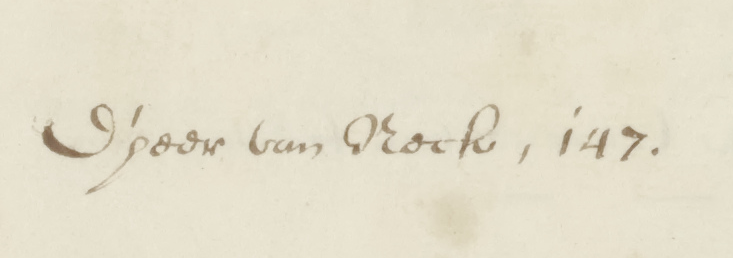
D' heer van Neck, 147.
